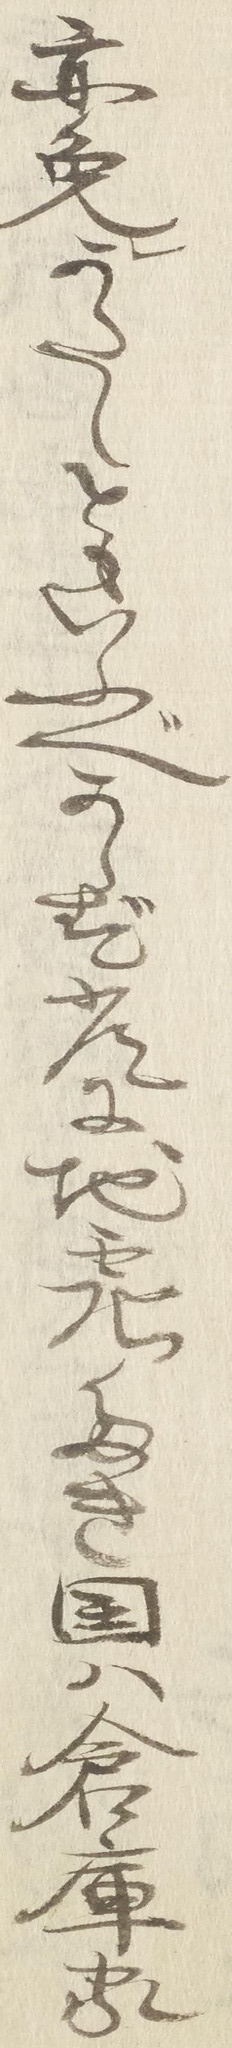亦免かたしとも言べからす常に地震多き国は倉庫家
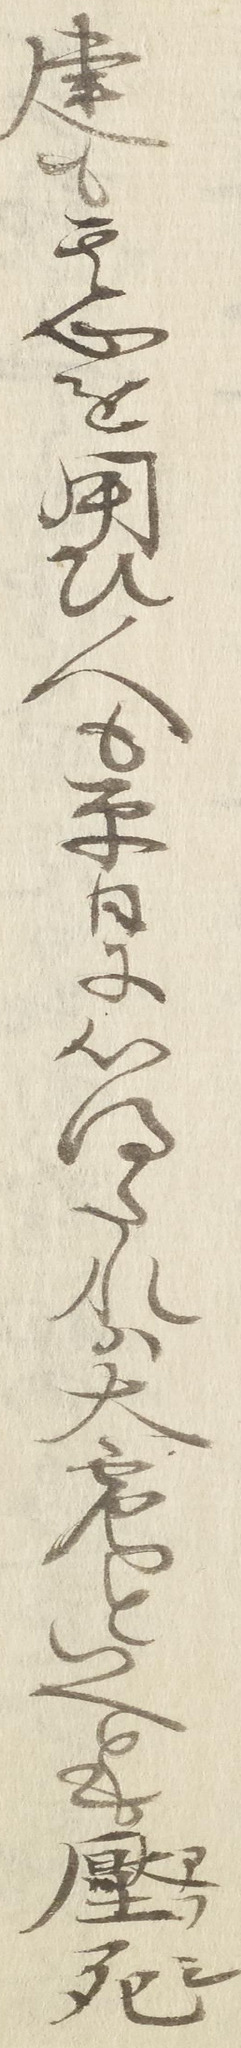建も其心を用ひ人も平日に心得たれは大震といへども圧死
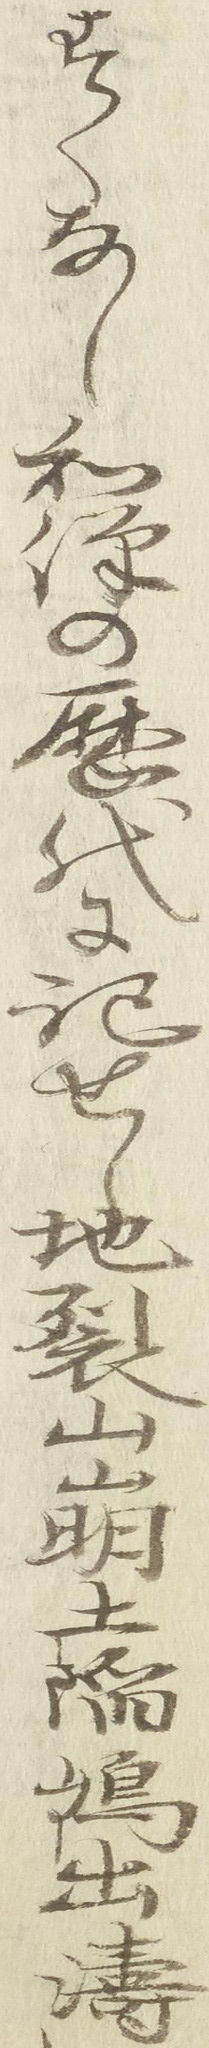すくなし和漢の歴代に記せし地裂山崩土-陥嶋出涛

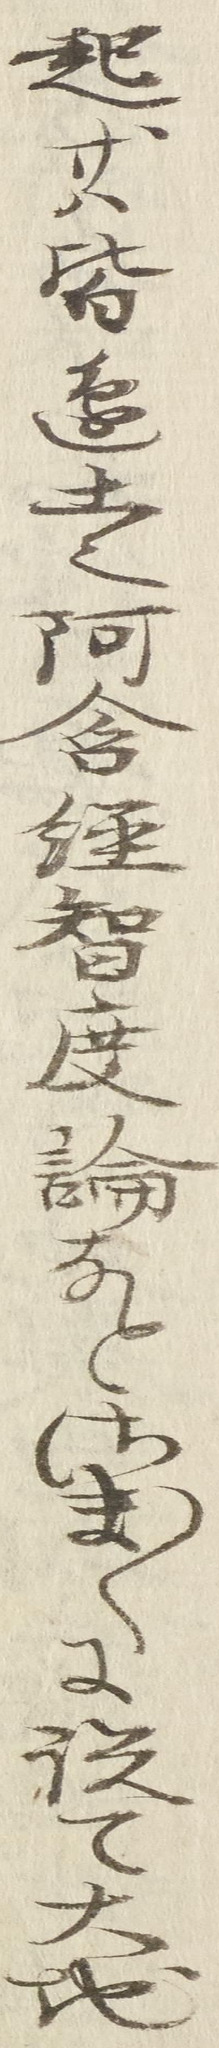起さは皆辺土也阿含経智度論などさま〳〵に説て大地
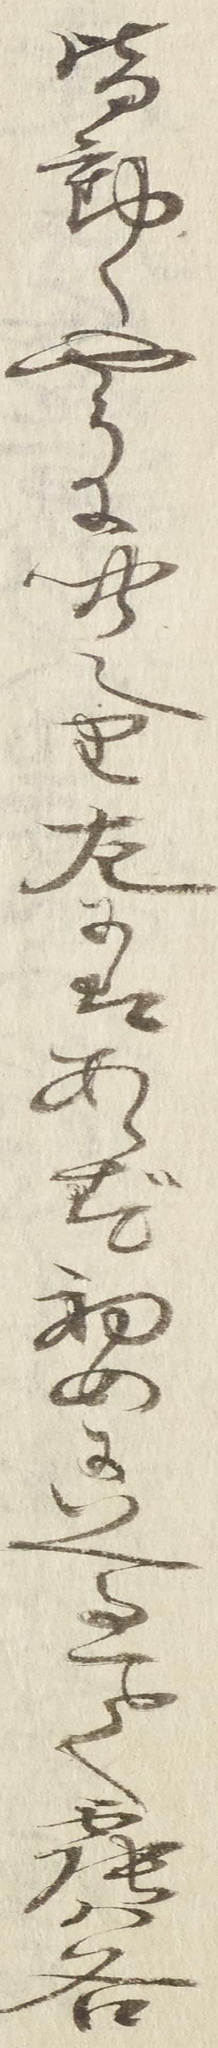皆動くやうに聞へり左にはあらず初めにいへることく震は各
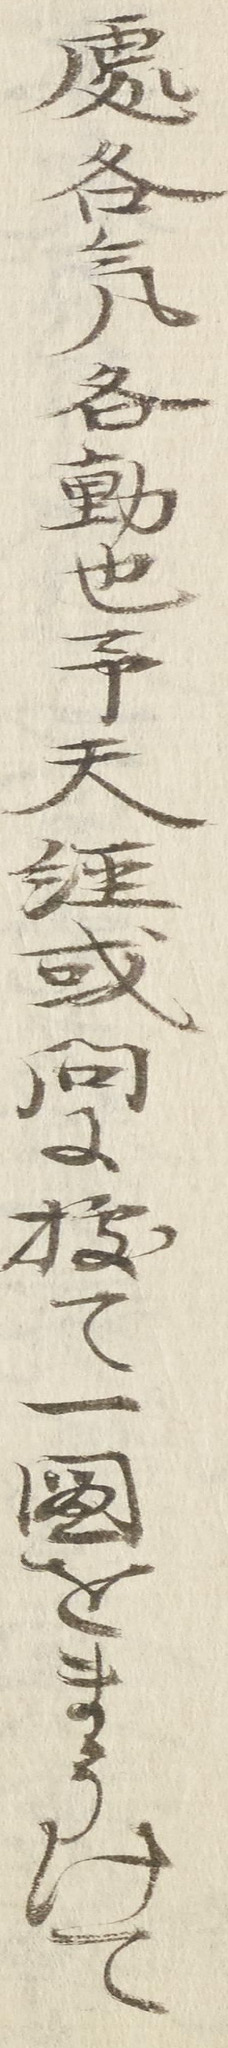処各気各動也予天経或問に拠て一図をまうけて
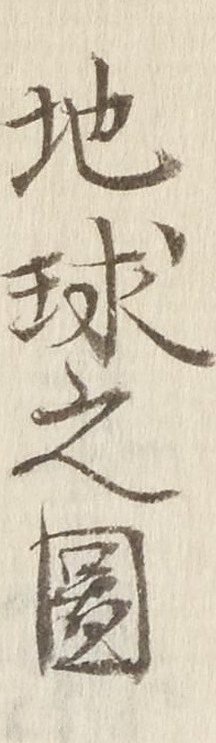地球之圖
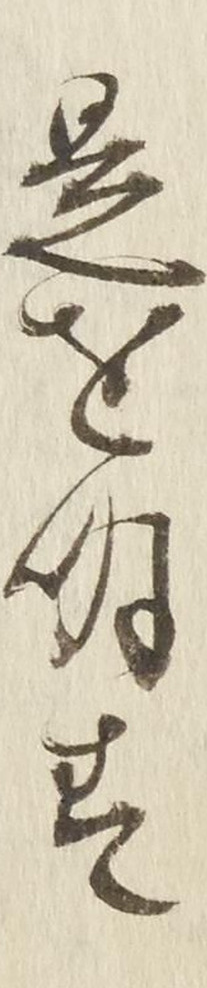是を明す
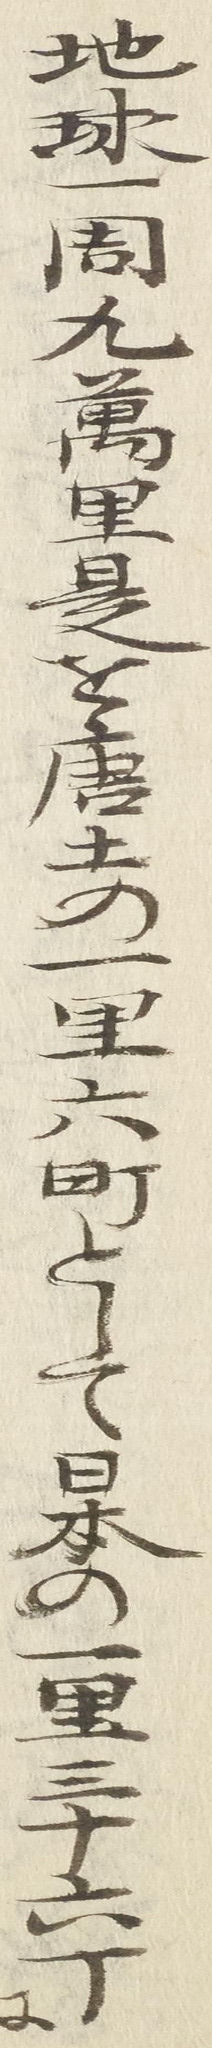地球一周九万里是を唐土の一里六町として日本の一里三十六丁に
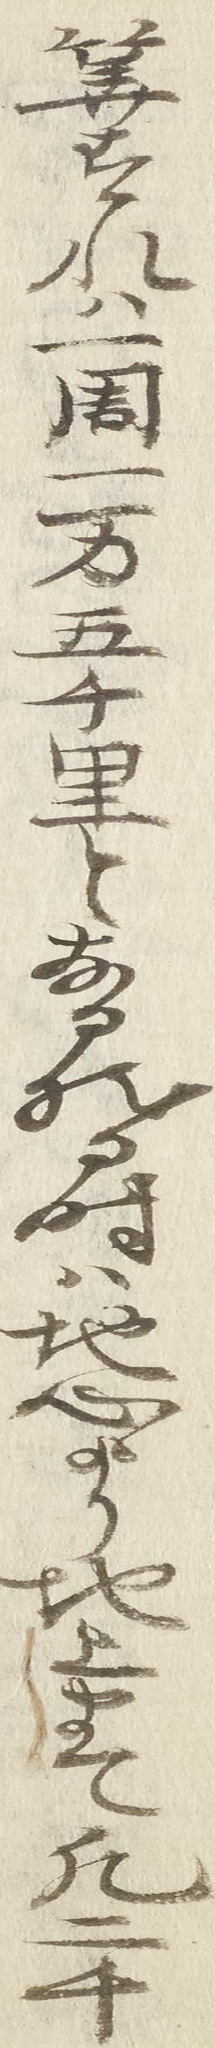算すれは一周一万五千里となる然る時は地心より地上まで凡二千
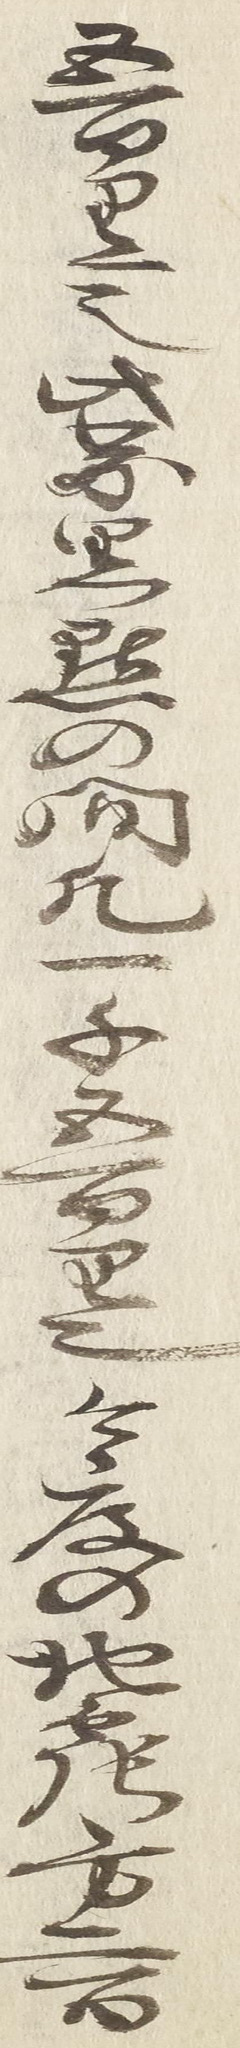五百里也此圖黒点の間凡一千五百里也今度の地震方二百
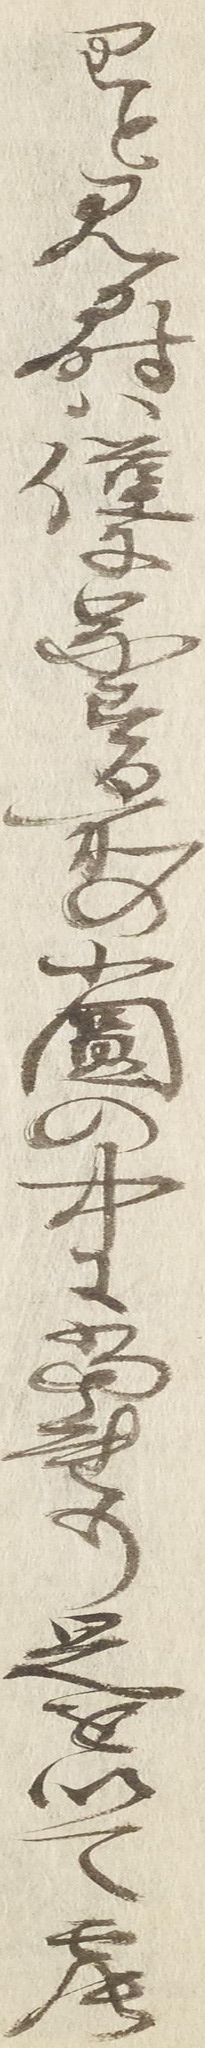里と見る時は僅に圖する所の小円の中に当れり是を以て震
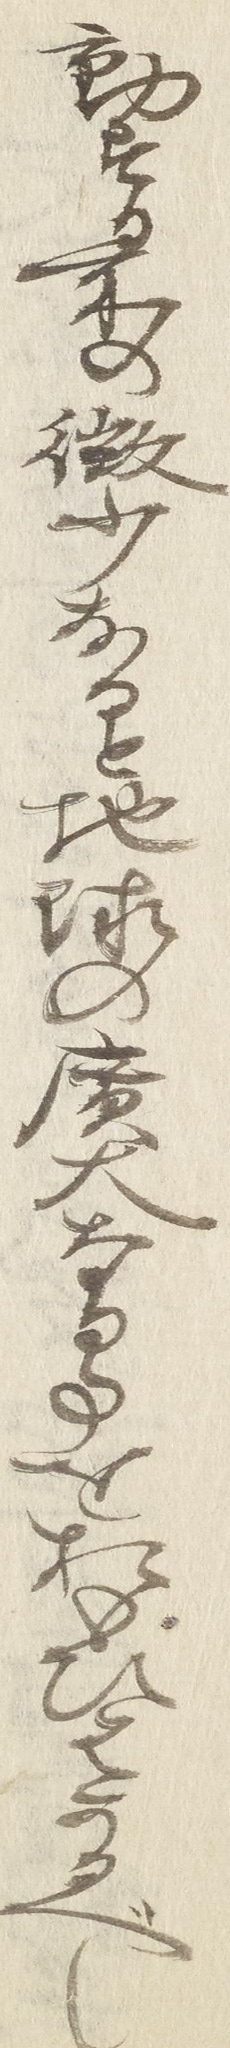動する所の微小なると地球の広大なる事をおもひはかるべし
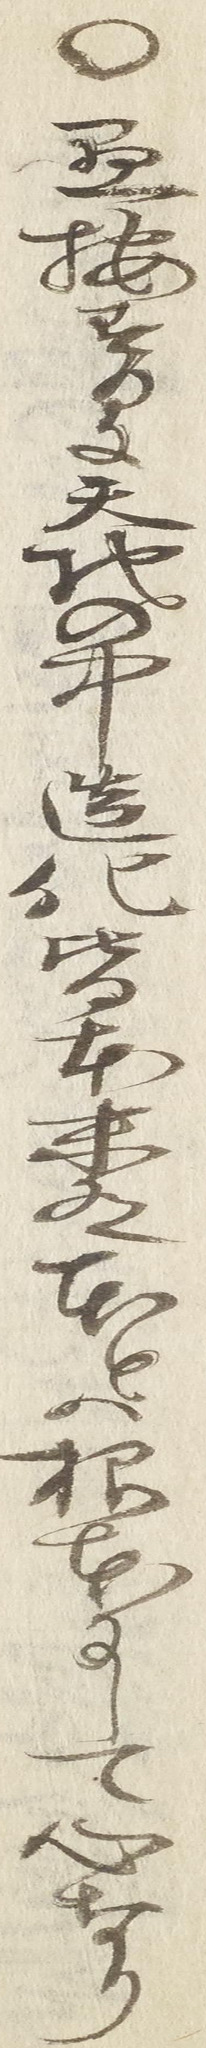○愚按するに天地の中造化皆本末有本とは根本にして心なり
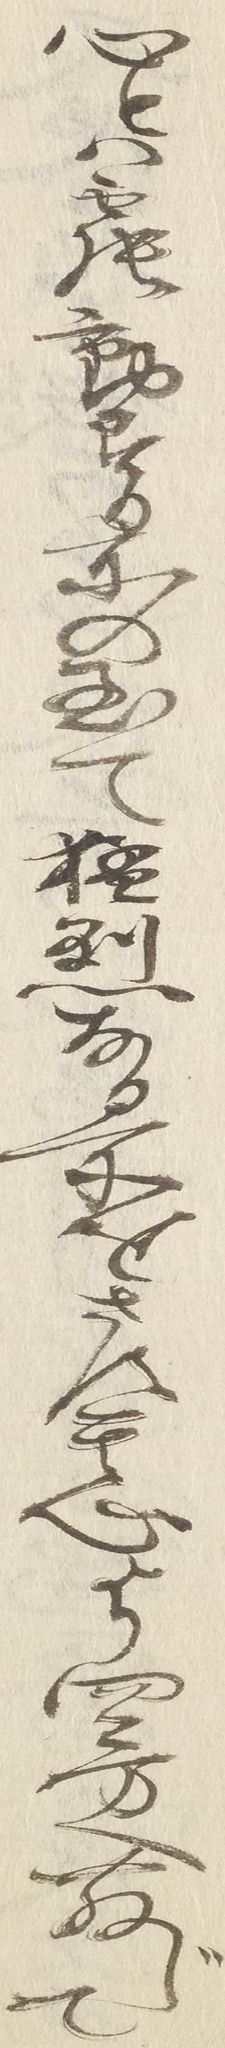心とは震動する所の至て猛-烈なる所をさす其心より四方へ散じて
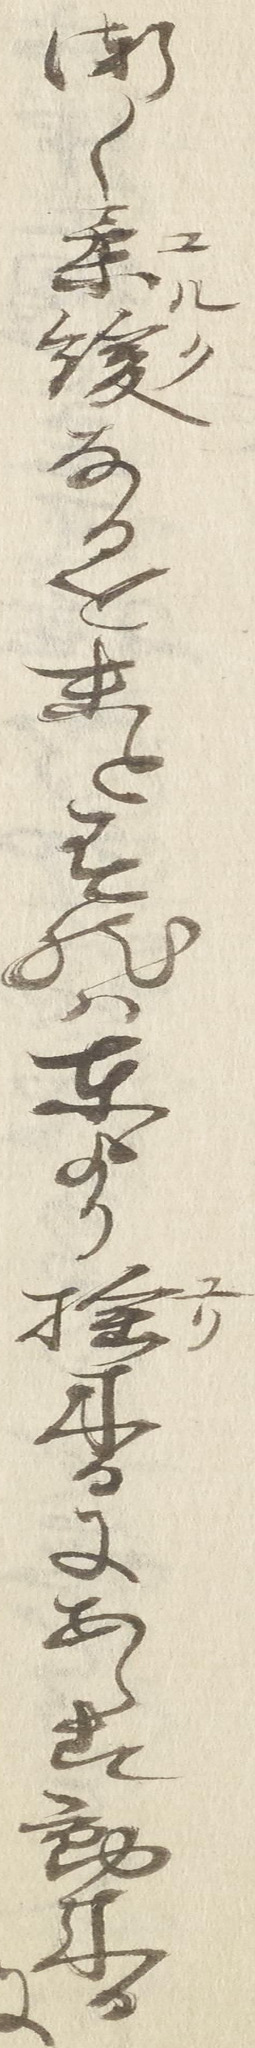漸く柔緩なるを末とす然は東より揺来るにあらず動来るに
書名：地震記　下
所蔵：東京大学地震研究所図書室 Earthquake Research Institute Library, The University of Tokyo, JAPAN
